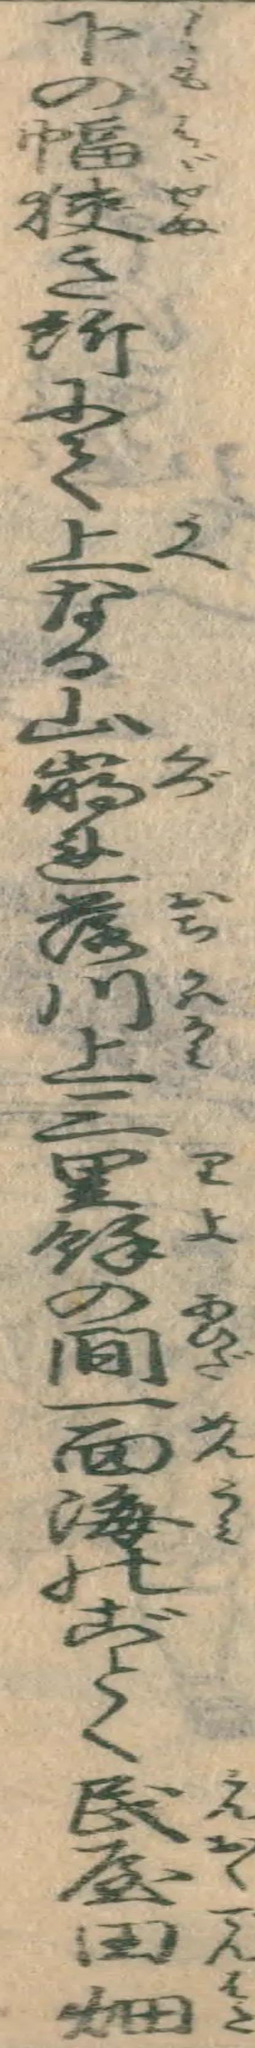下の幅狭き所にて上なる山崩れ落川上さん里余の間一面海のごとく民屋田畑
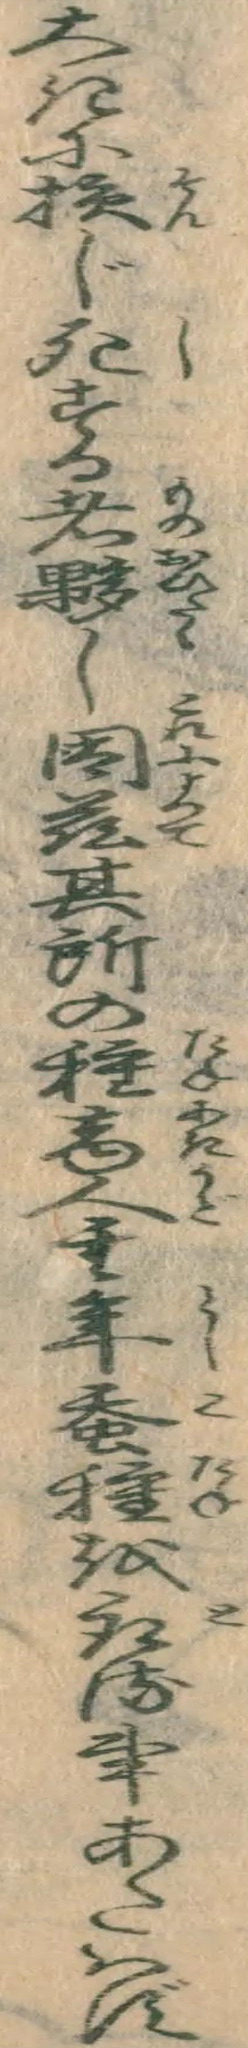大きに損じ死する者夥し因茲其所の種商人其年蚕種を取る事あたはず
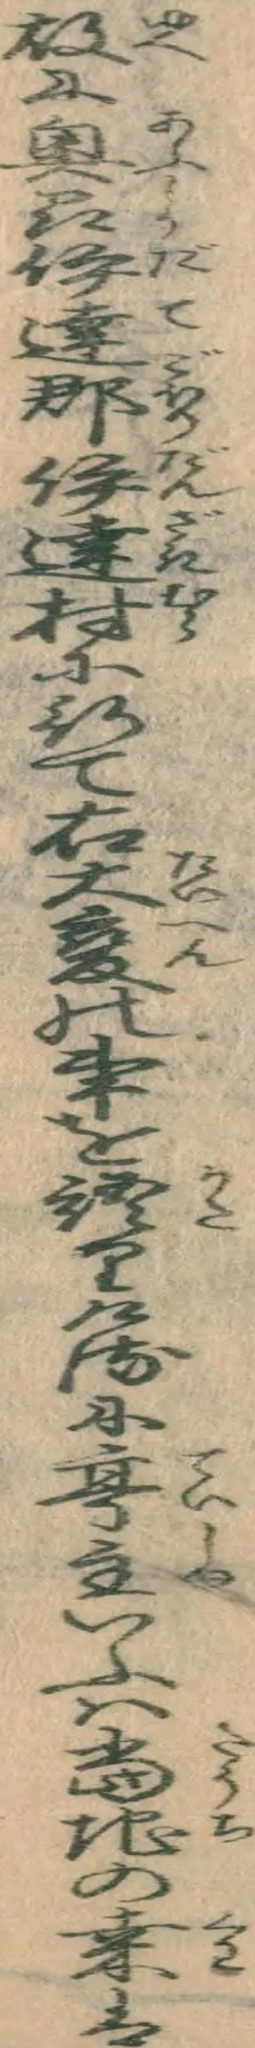故に奥州伊達郡伊達村に行て右大変の事を語りけるに亭主いふは当地の桑は
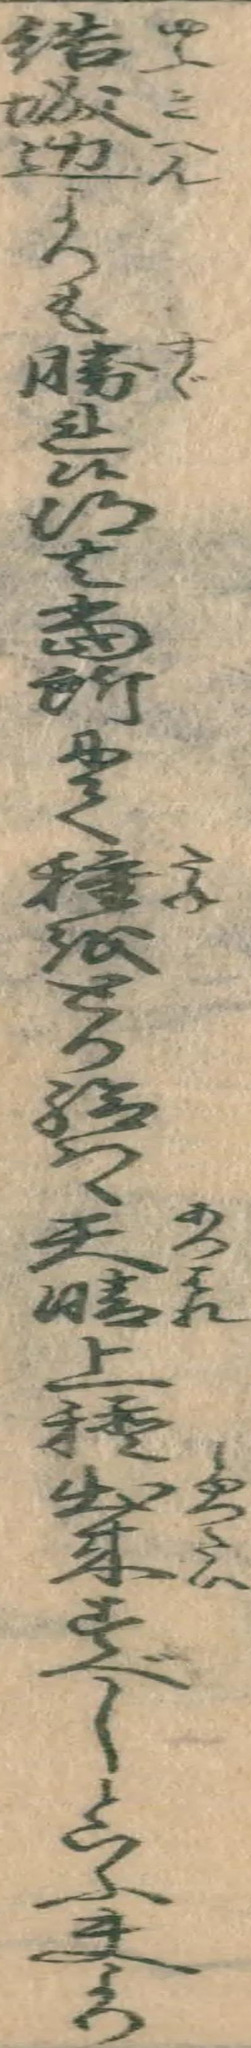結城辺よりも勝れ候得共当所いて種をとり給はゝ天晴上種出来すべしといふ夫より
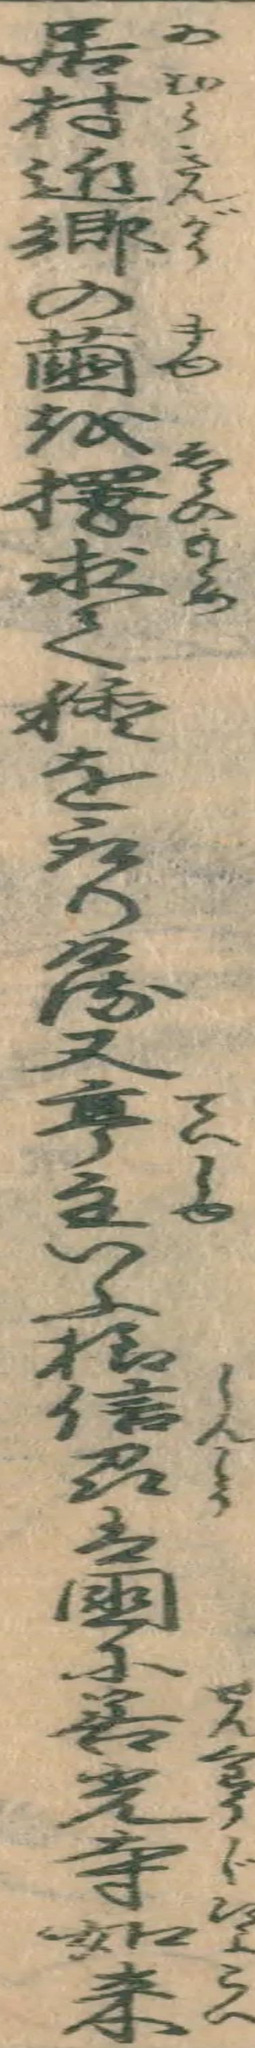居村近郷の繭を撰求て種を取りける又亭主いふ様信州は国に善光寺如来
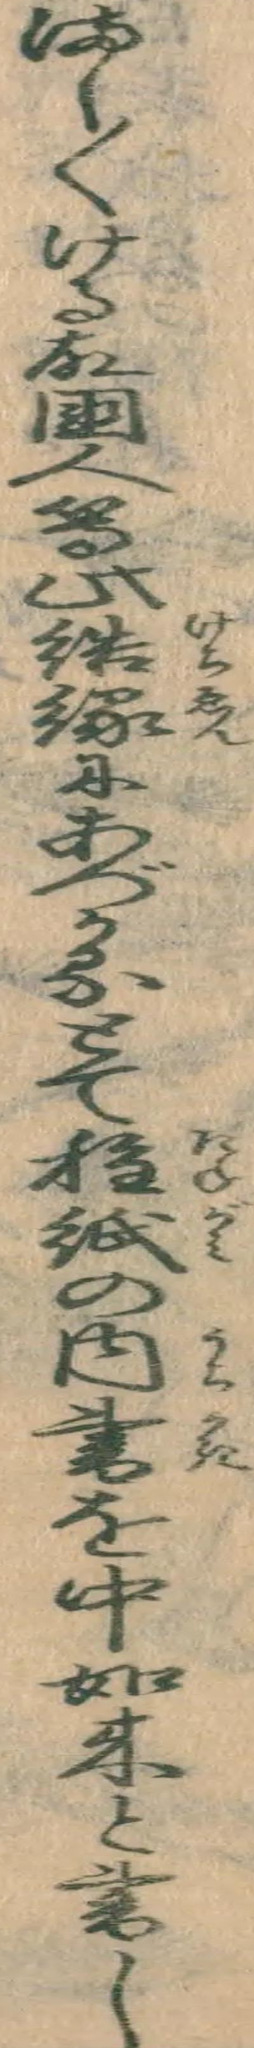まし〳〵ける故国人等此結縁にあづかるとて種紙の内書を中如来と書し
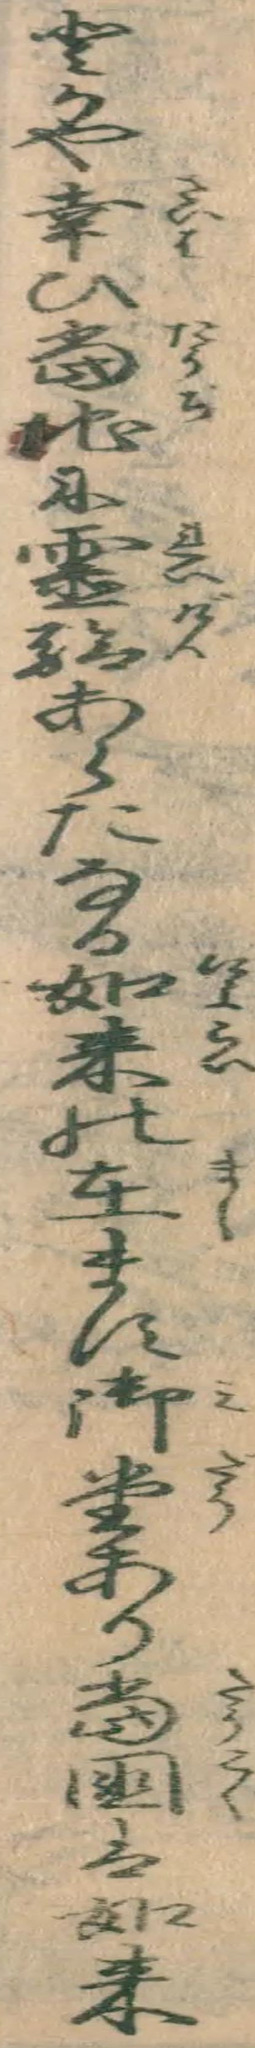とかや幸ひ当地に霊験あらたなる如来の在ます御堂あり当国は如来
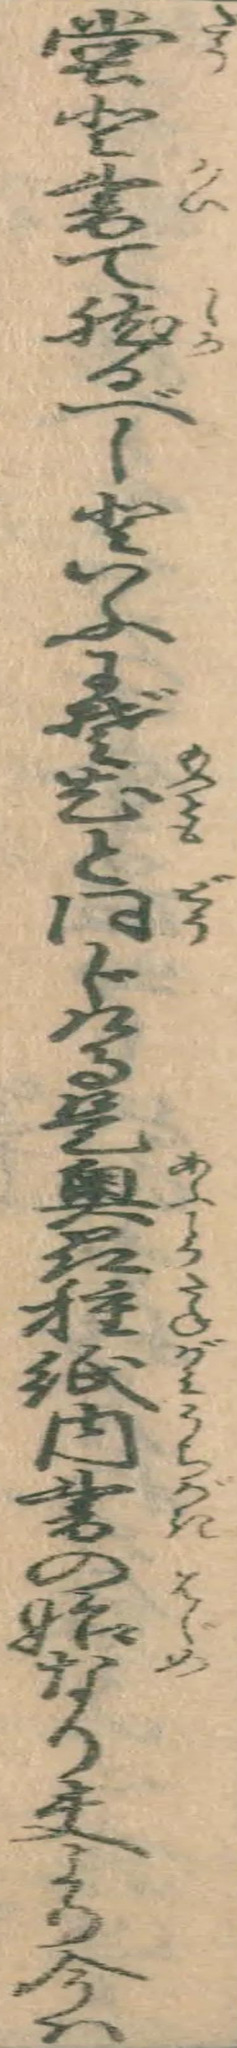堂と書て然るべしといふにぞ尤と同じける是奥州種紙内書きの始なり夫より今は
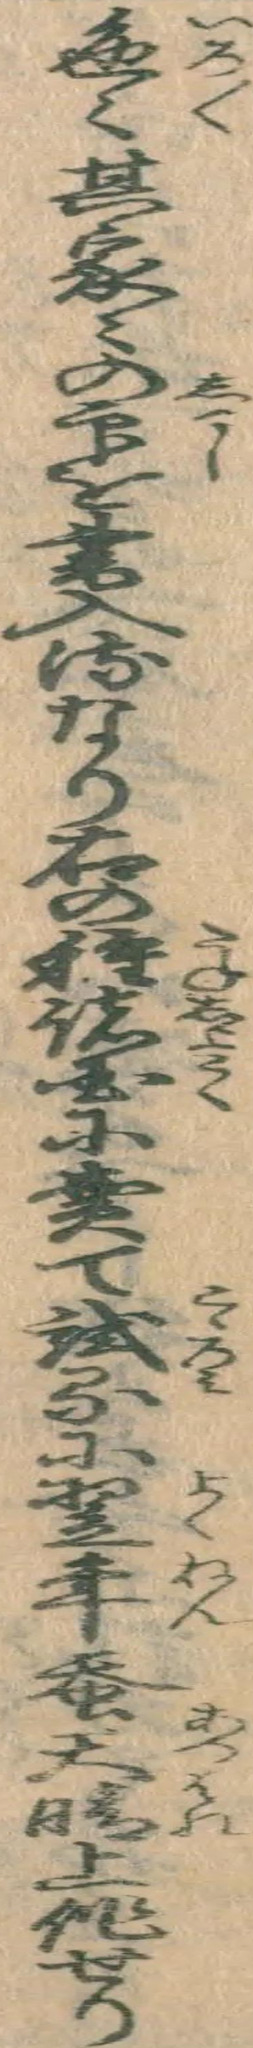色々其家々の印を書入るなり右の種諸国に売て試るに翌年蚕天晴上作せり
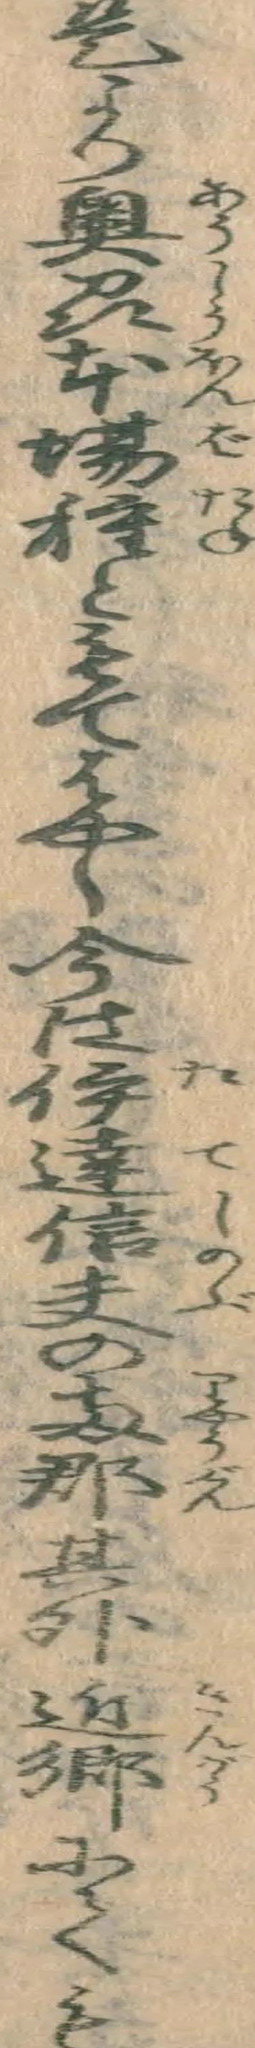是より奥州本場種ともてはやし今は伊達信夫の両郡其外近郷にても
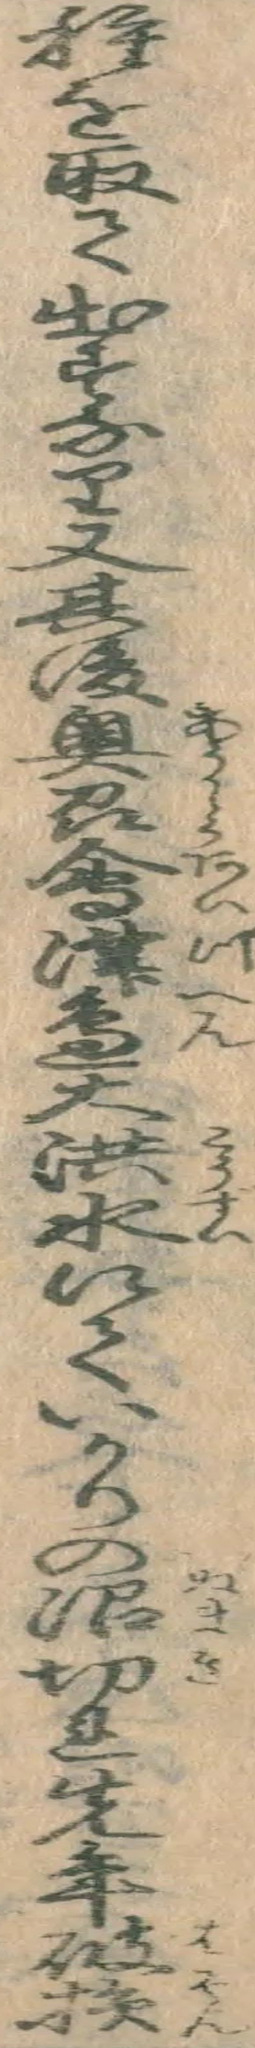種を取て出すなり又其後奥州会津辺大洪水にていかりの沼切れ千年破損
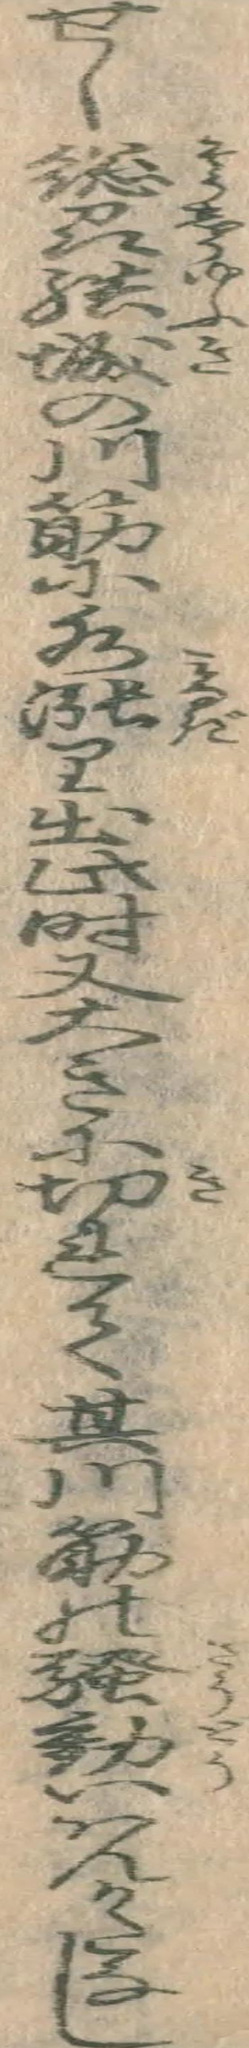せし総州結城の川筋に水漲り出此時又大きに切れて其川筋の騒動いはんかたなし
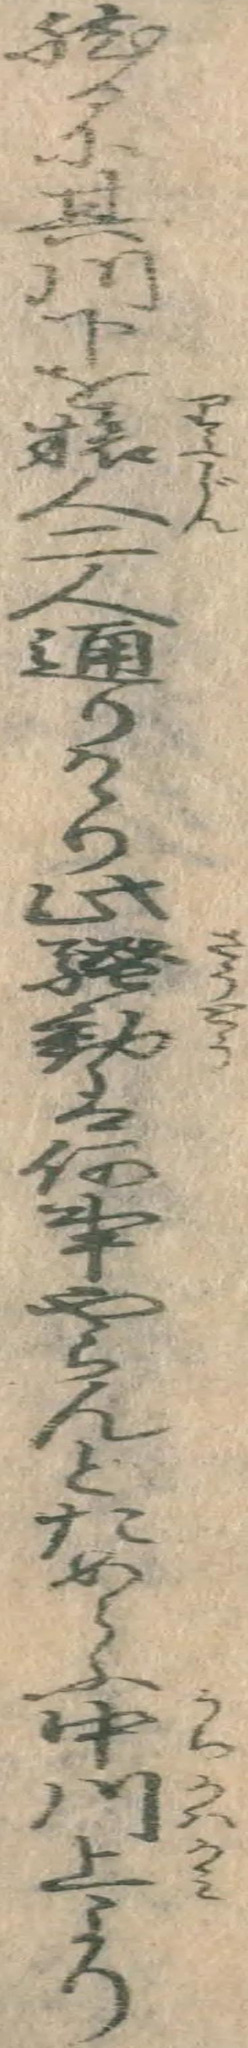然に其川下を旅人二人通りかゝり此騒動は何事やらんとためらふ中川上より
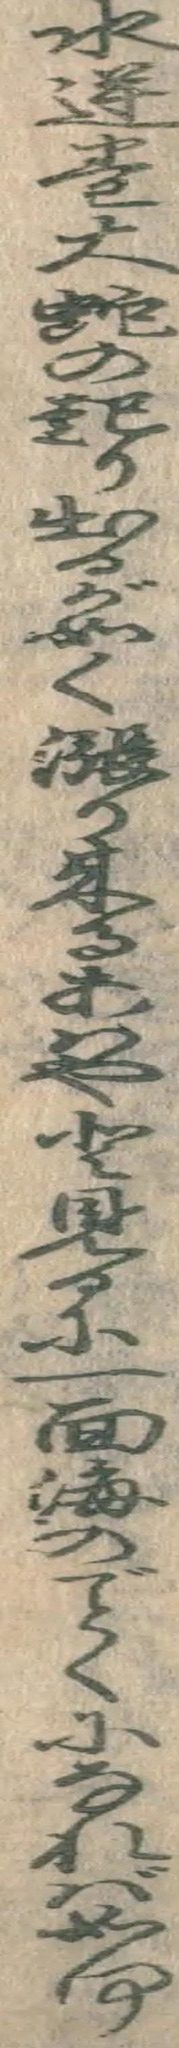水逆巻大蛇の起り出るが如く漲り来るあはやと見るに一面海のごとくになれば如何
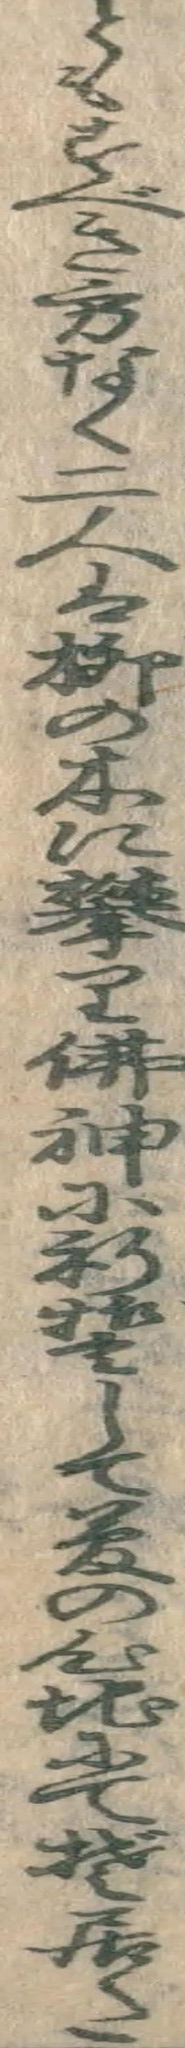ともすべき方なく二人は柳の木に攀り仏神に祈誓して夢の心地にてぞ居た
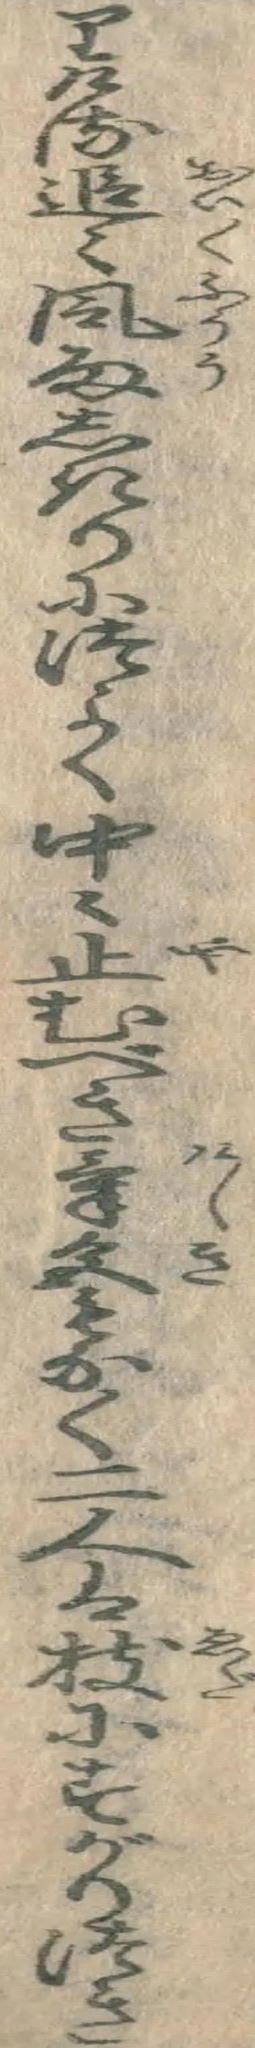りける追々風雨しきりにつよく中々止むべき気色もなく二人は枝にすがりつき
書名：養蚕秘録 3巻. [3]
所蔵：国立国会図書館 National Diet Library, JAPAN
